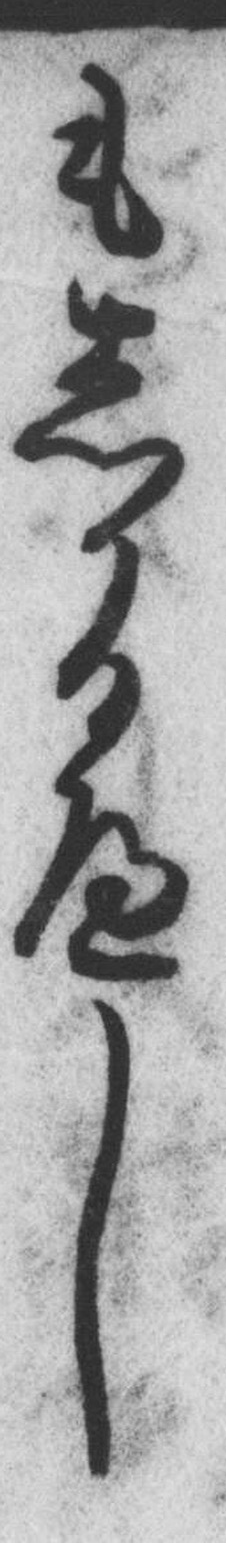もしかるへし
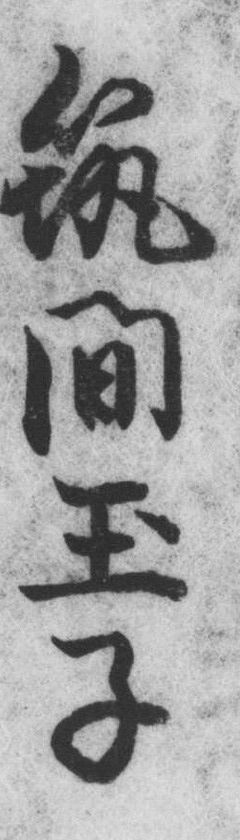筑間玉子
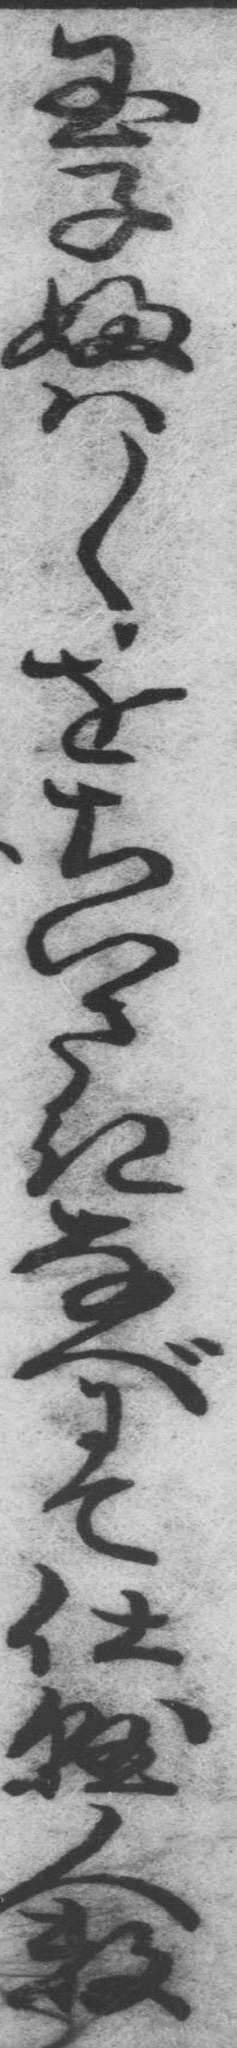玉子ふは〳〵をちいさきなべにて仕懸人数
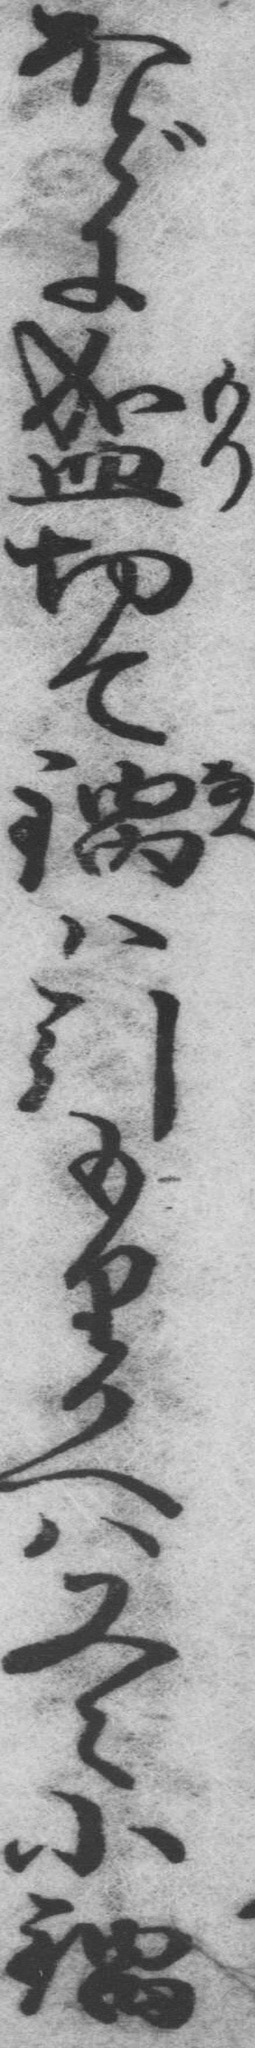ほどに盛切て鍋は引もりかへは又々小鍋
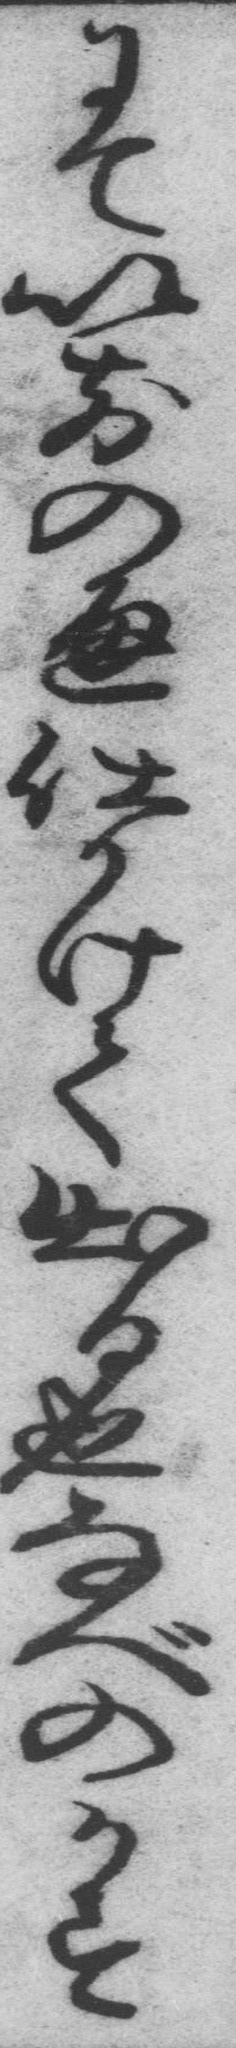にて以前の通仕かけて出る也なべのかす
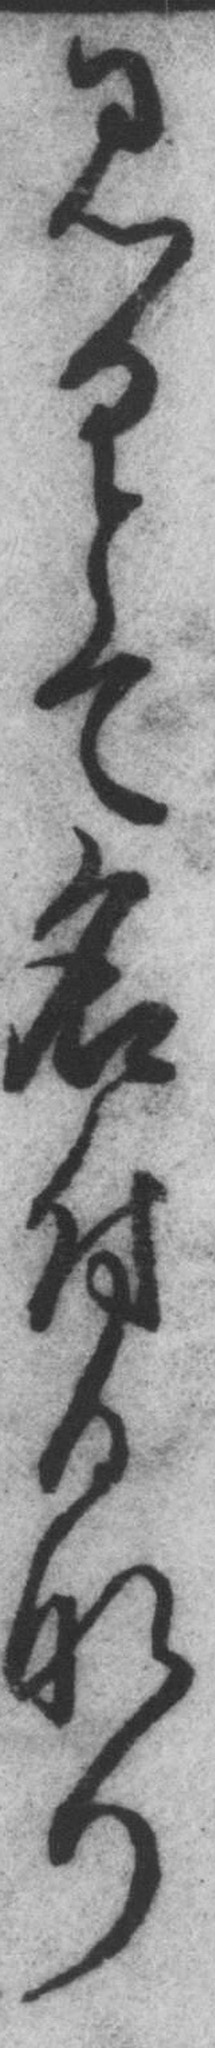みるとて名付るなり

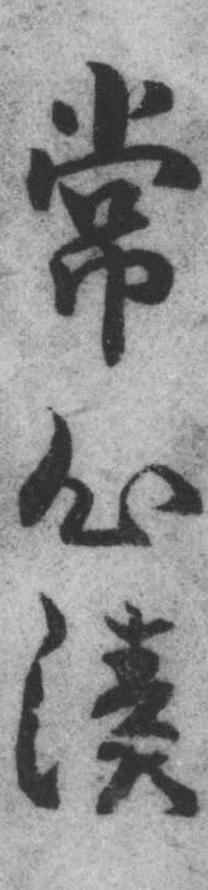常心漬
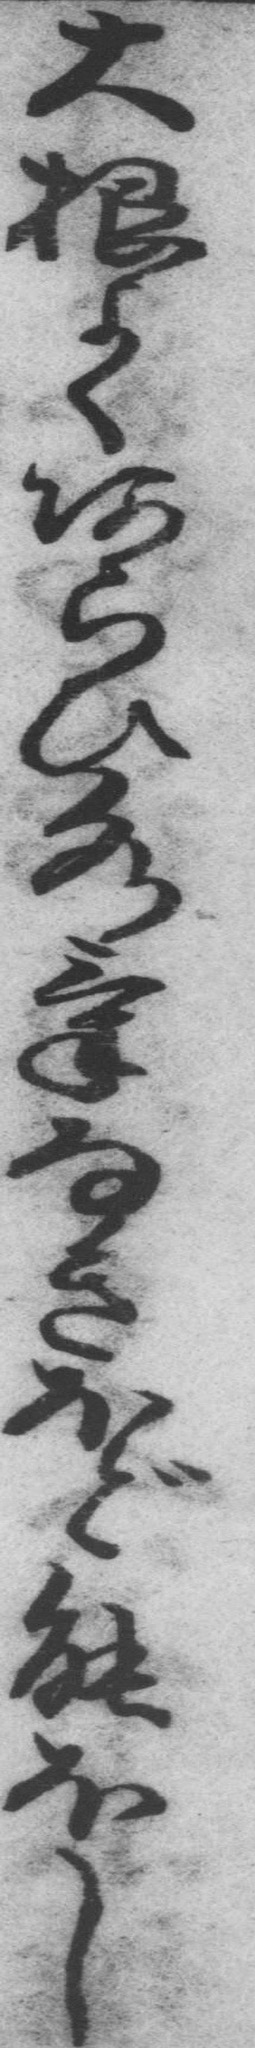大根よくあらひ水気なきほど能ほし
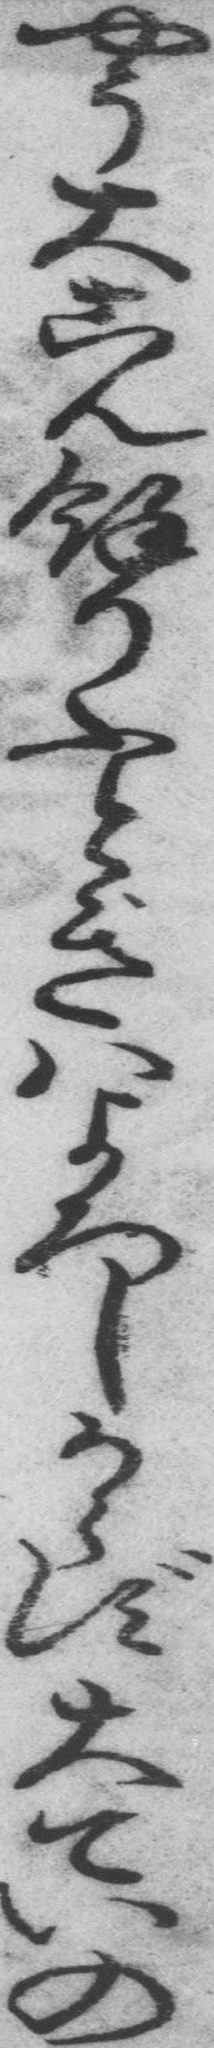やう大こん余りふときはよろしからず大ていの
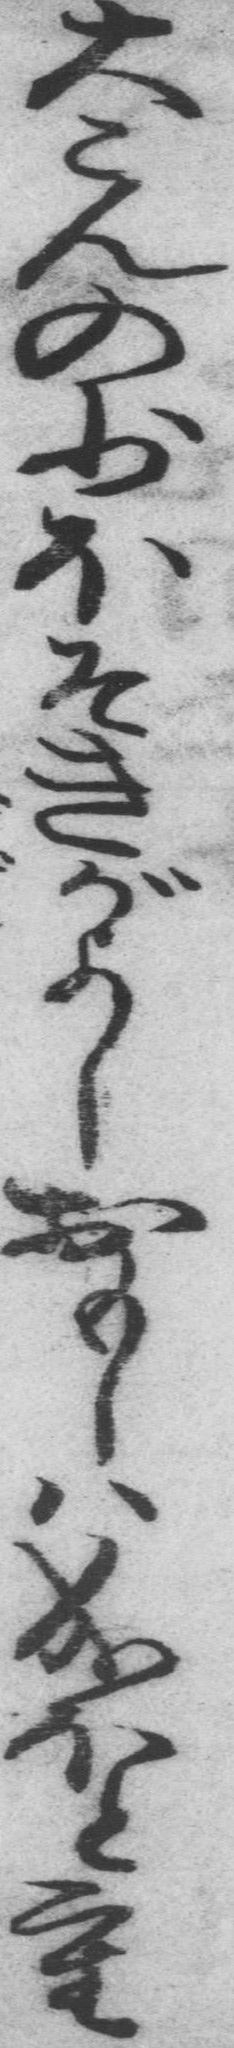大こんの少ほそきがよしおもしは成ほと重
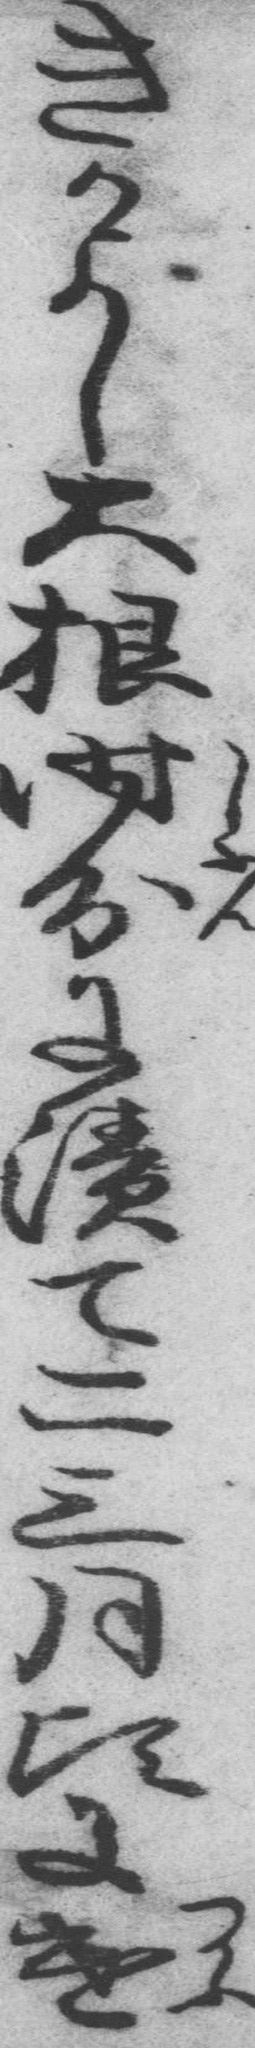きかよし大根時分に漬て二三月頃に遣
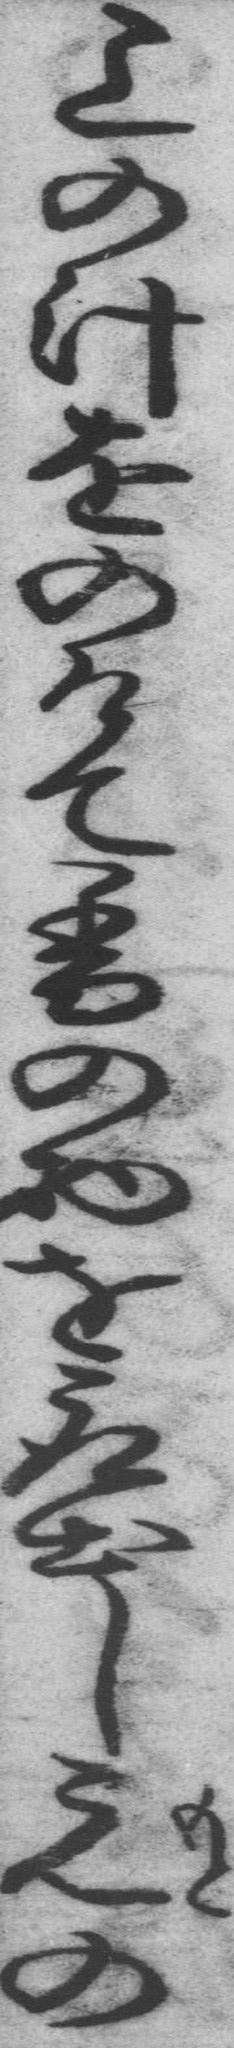上の汁をのけて香の物を取出し元の
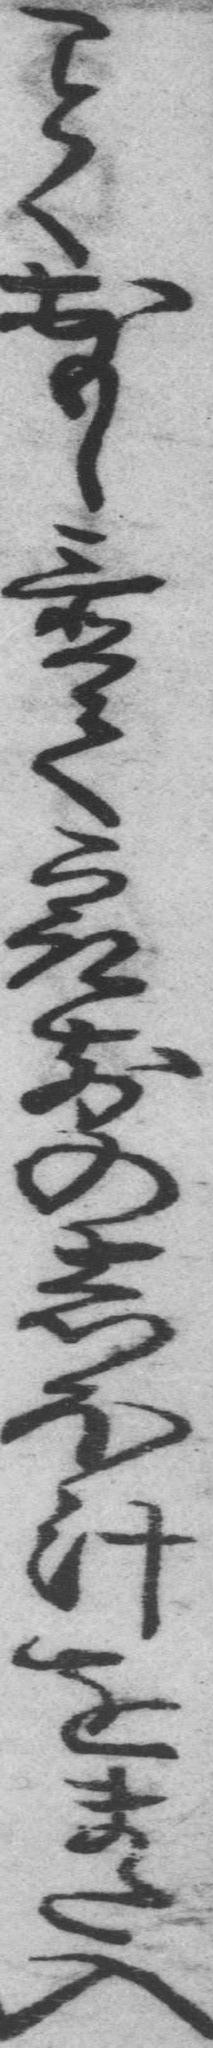ことくおもし置て最前のしほ汁をまた入
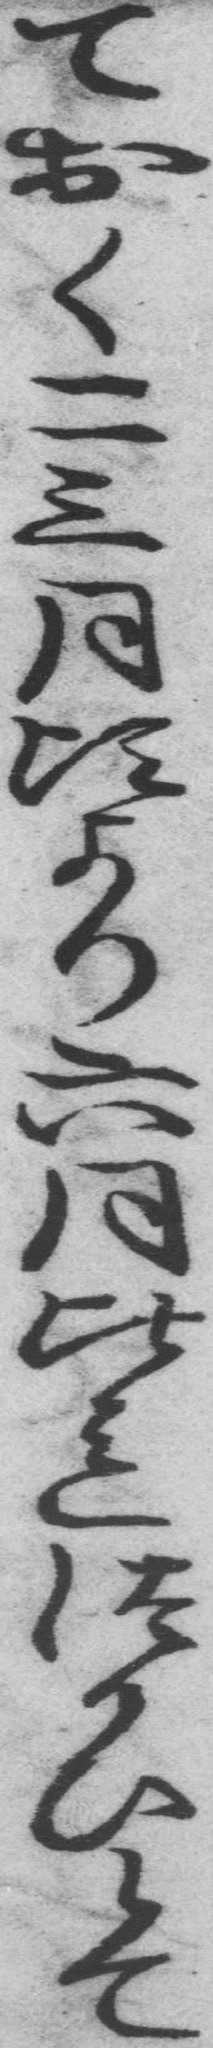ておく二三月頃より六月比迄つかひ候て
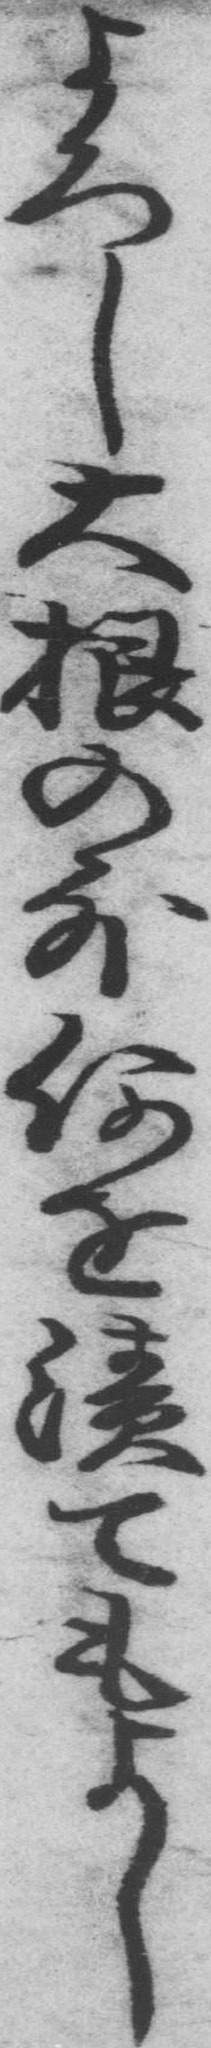よろし大根の外何を漬てもよし
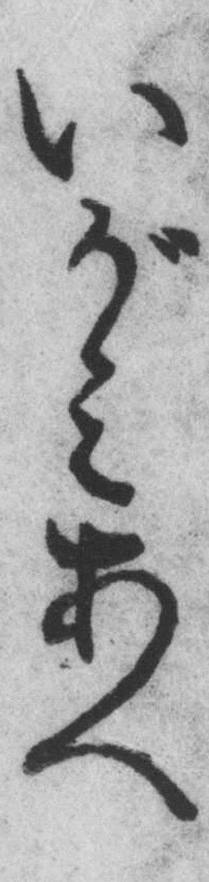いがみあへ
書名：料理山海郷
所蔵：大阪府立大学学術情報センター 国文学研究資料館
